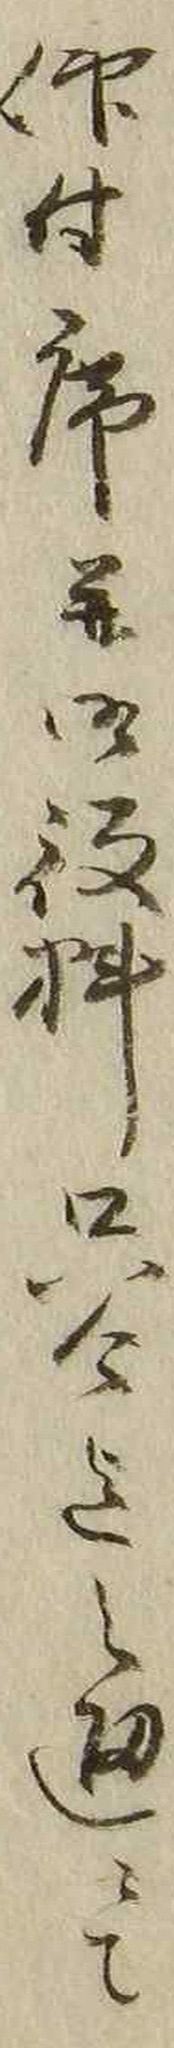仰付席并御役料只今迄之通ニて
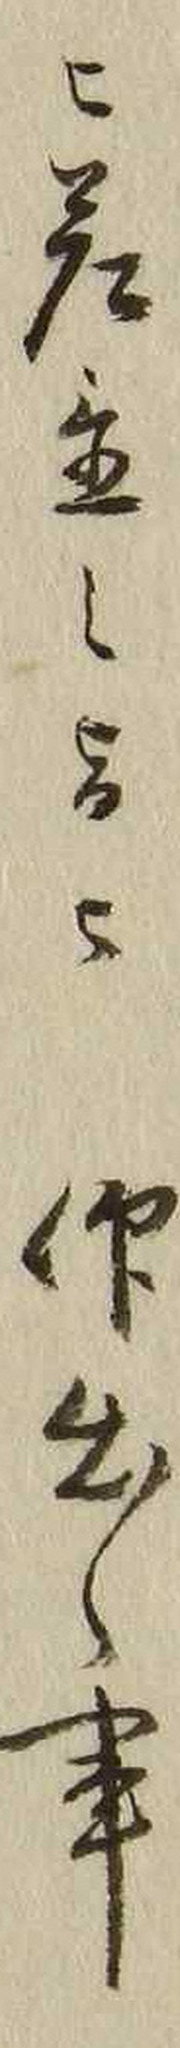被差置之旨被仰出候事
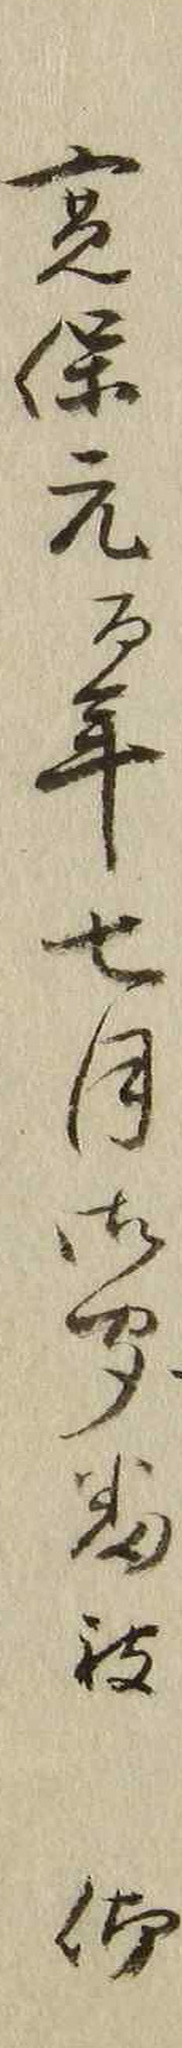一寛保元酉年七月御聞番被仰
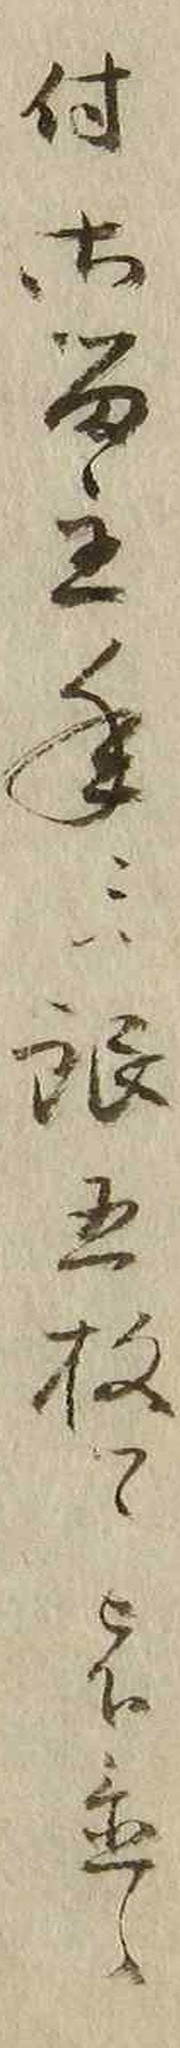付御留主年ニハ銀五枚ツヽ被下置候
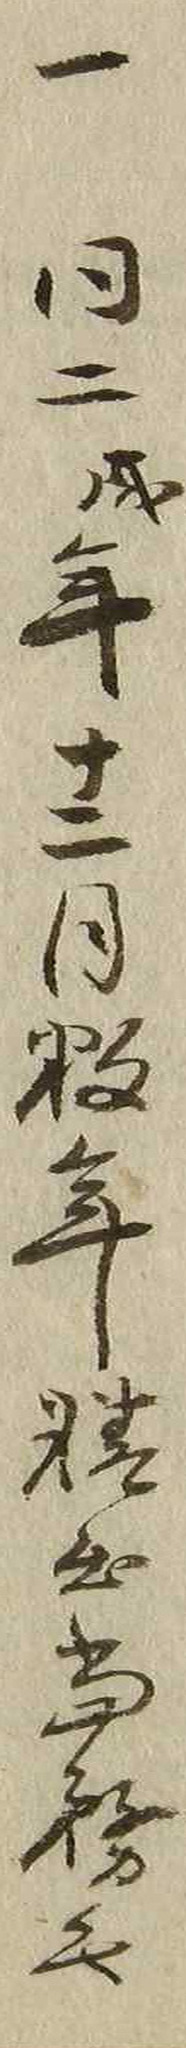一同二戌年十二月数年精出当務無
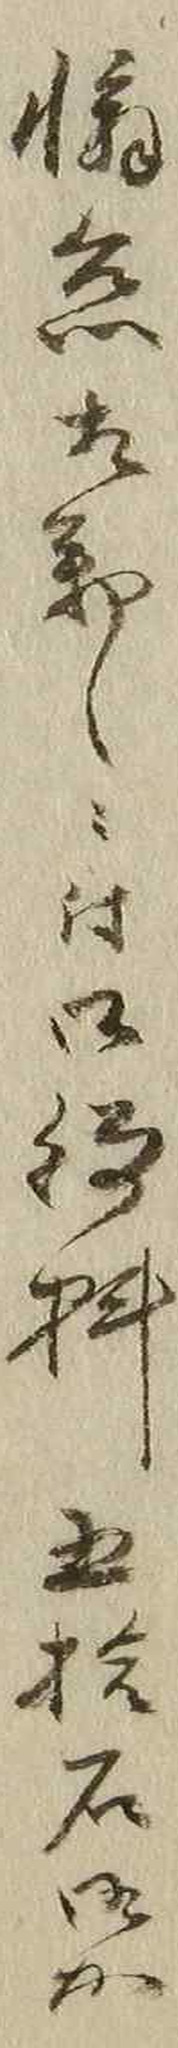懈怠相勤候ニ付御役料五拾石御加
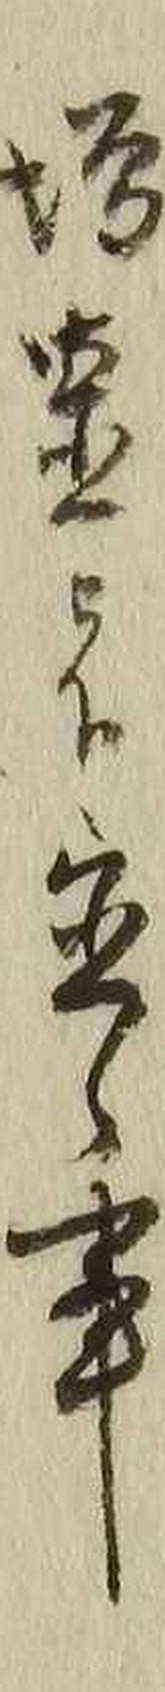増御直被下置候事
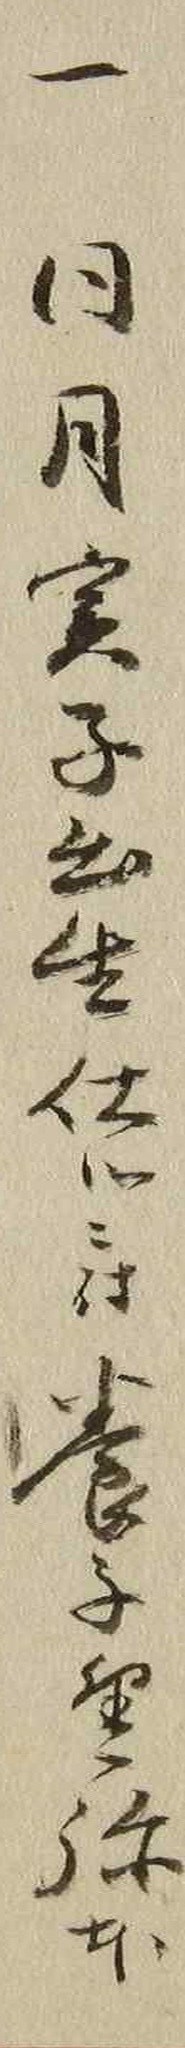一同月実子出生仕候ニ付養子望弥本
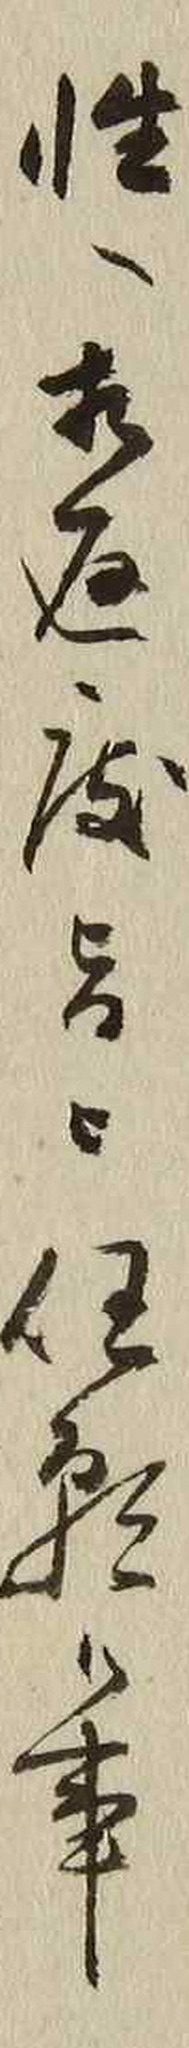性へ相返度旨被任願候事
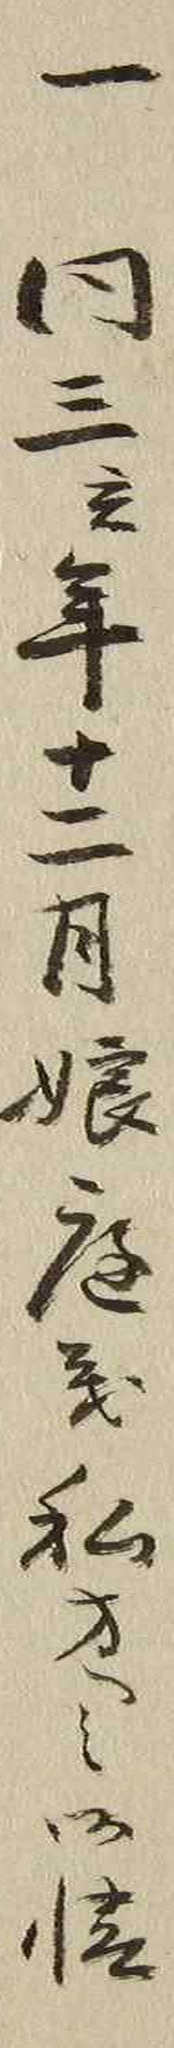一同三亥年十二月娘庭義私方へ之御情
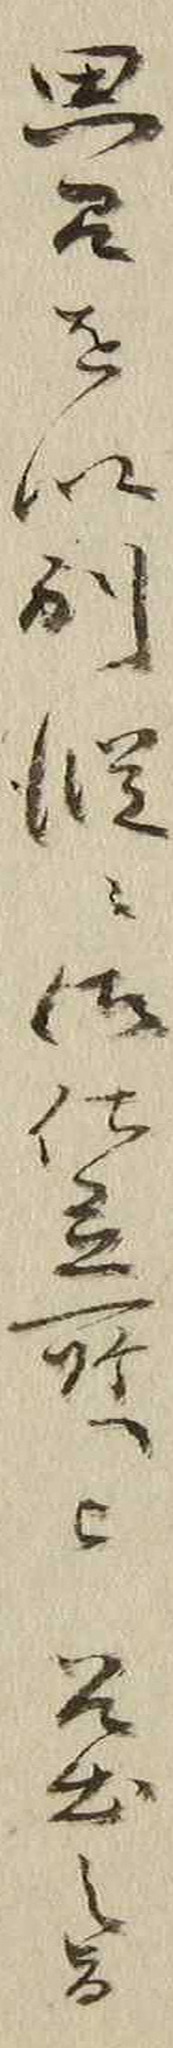思召を以別段ニ御仕立所へ被召出之旨
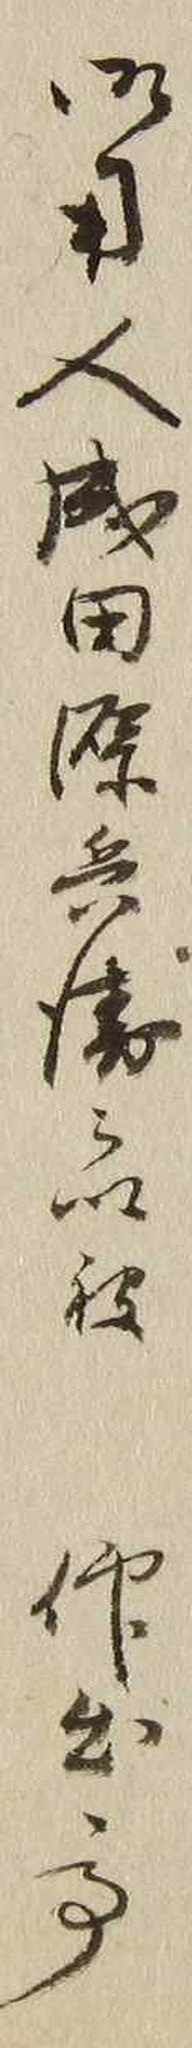御用人成田源兵衛之以被仰出候事
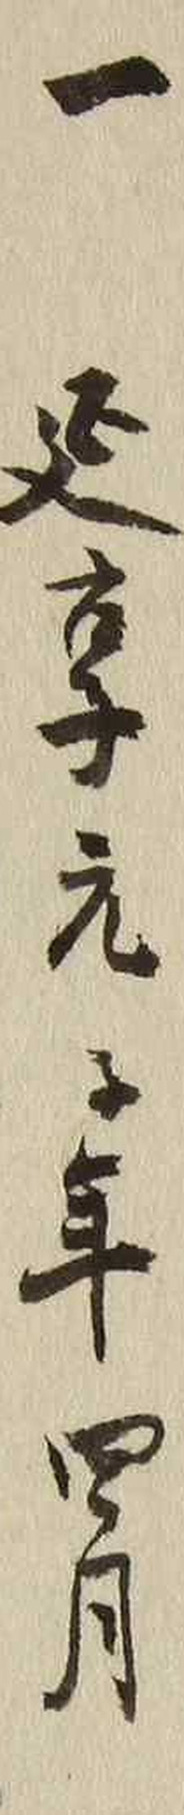一延享元子年四月
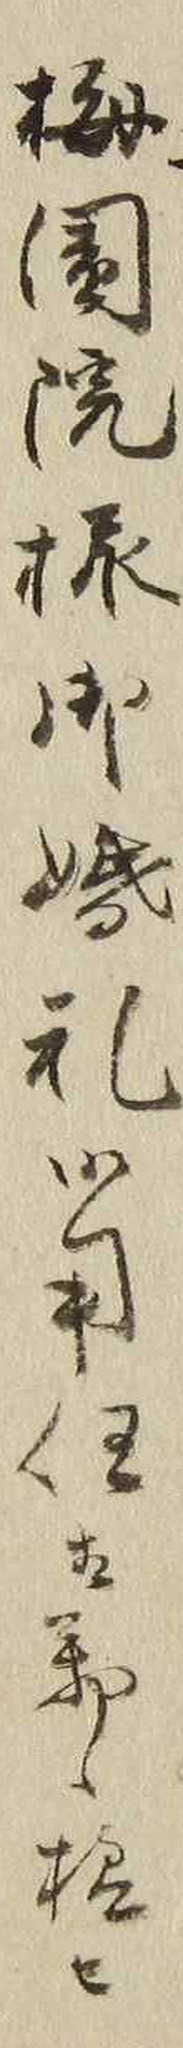梅園院様御婚礼御用任相勤候様被
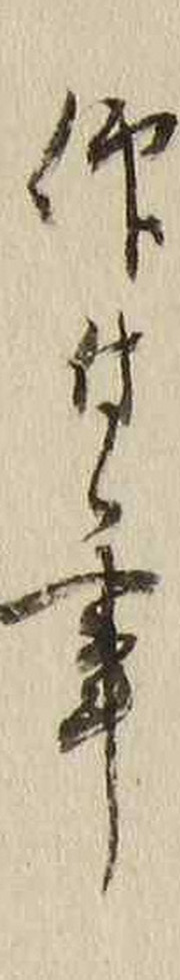仰付候事
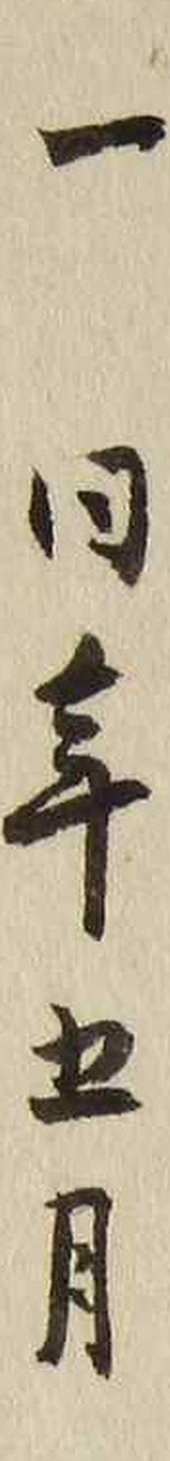一同年五月
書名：諸士系譜　巻之225　ま之部6
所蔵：会津若松市立会津図書館
